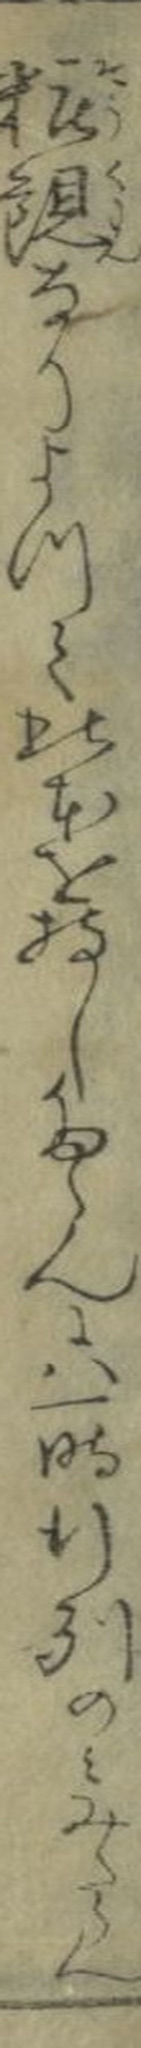粧観なりよつて此本を持したらんには一時行列のみみたらん
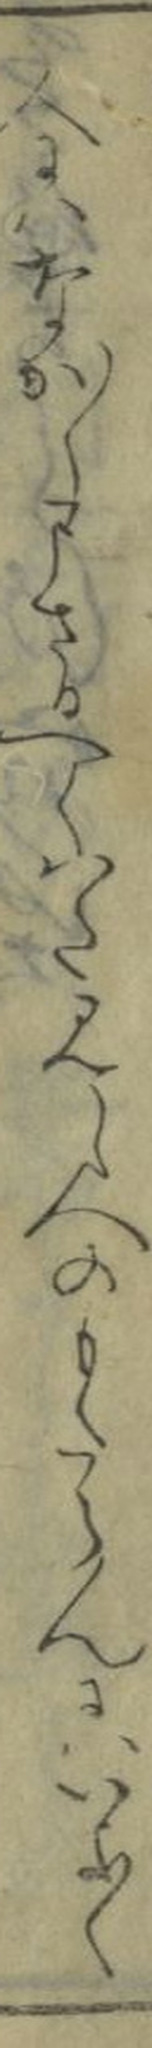人にはなか〳〵まさるへくはた見し人のもたらんにはいよ〳〵
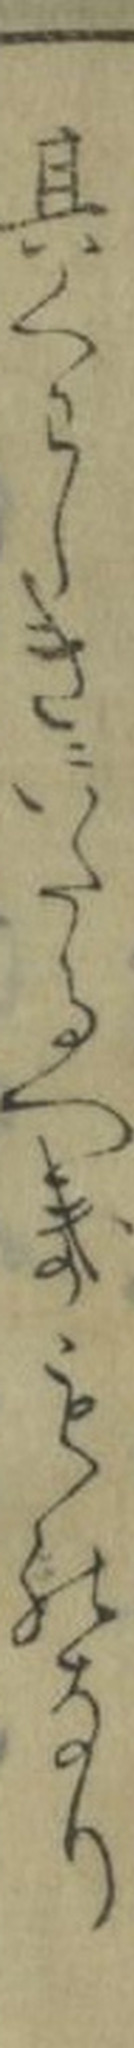其くわしきにいたるへきものなり
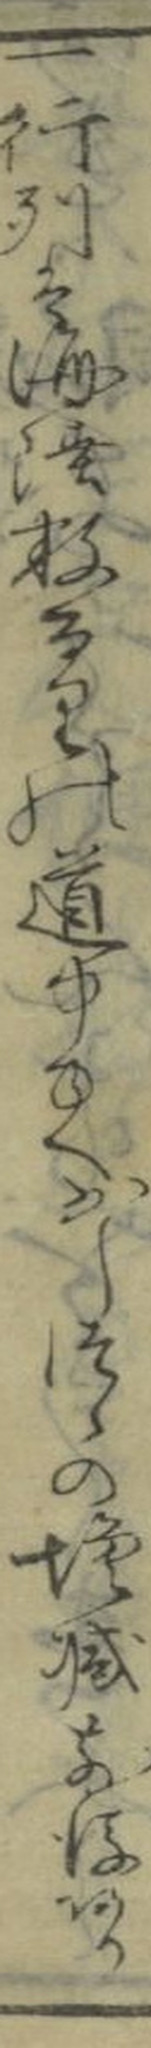一行列は海陸数百里の道中ゆへ少しつゝの増減前後あり
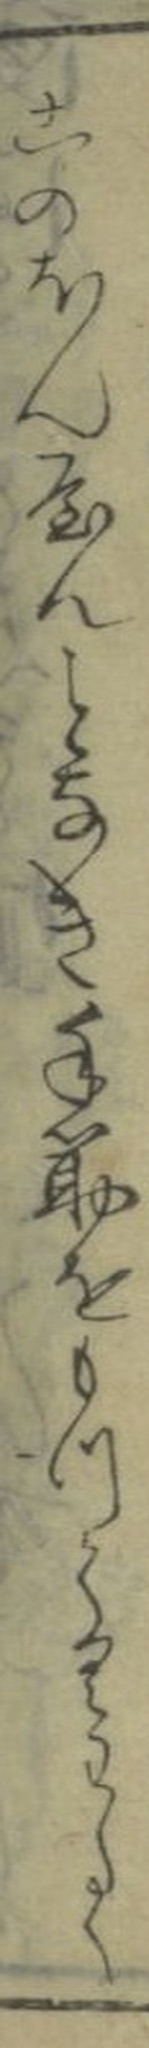このほんやんことなき手筋をもつてくわしく
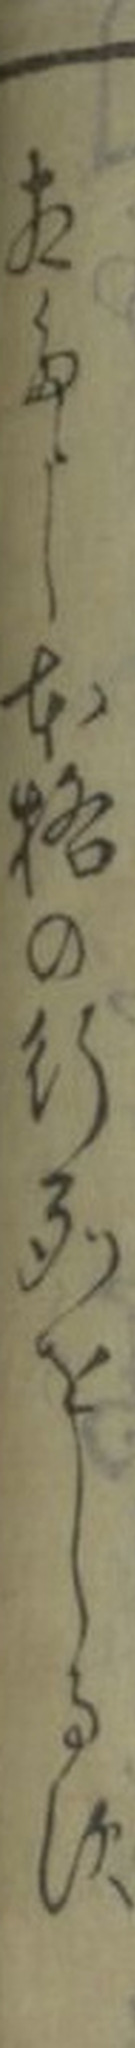相たゝし本格の行列をしるす
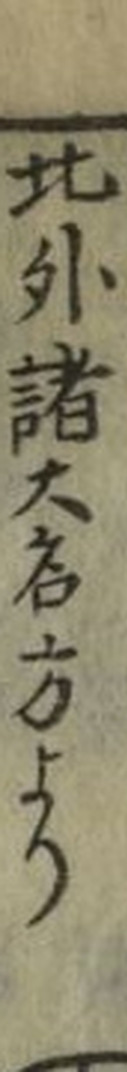此外諸大名方より
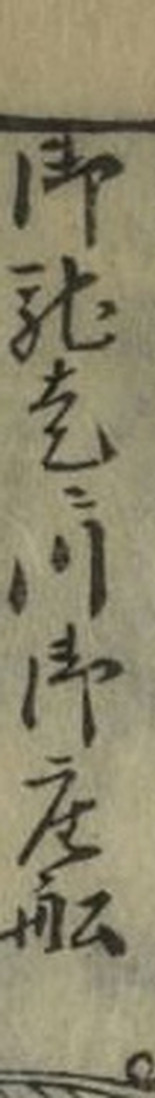御馳走に川御座船
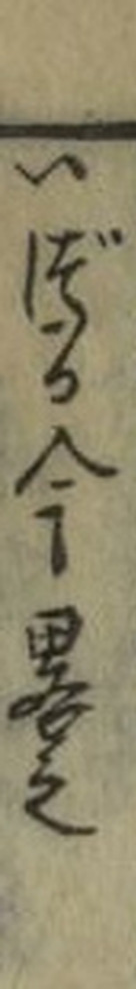いづる今略之

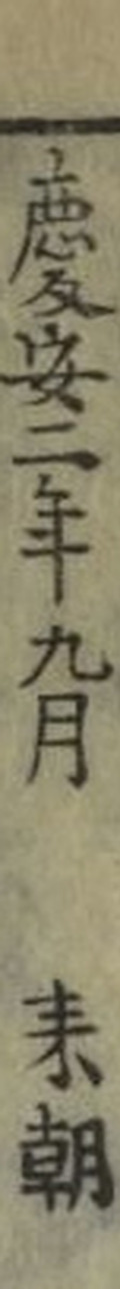慶安二年九月来朝
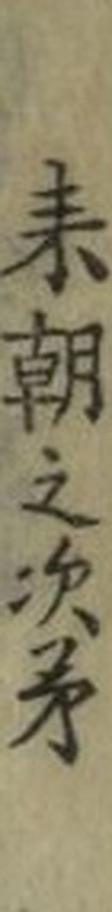来朝之次第
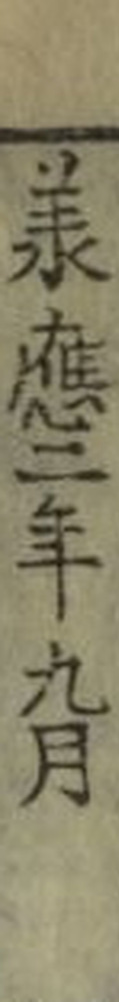承応二年九月同
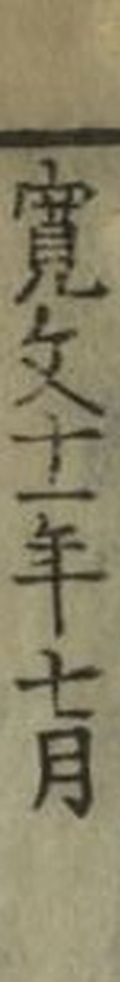寛文十一年七月同
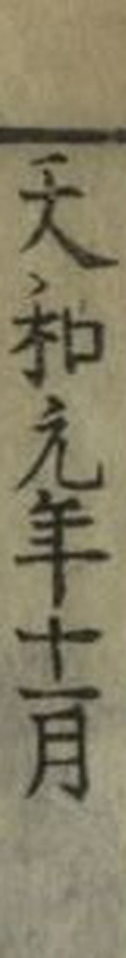天和元年十一月同
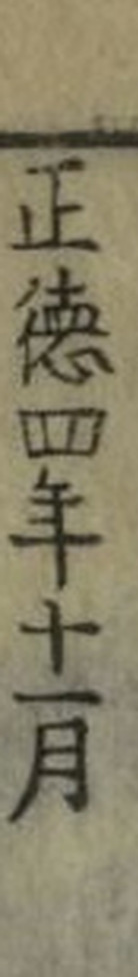正徳四年十一月同
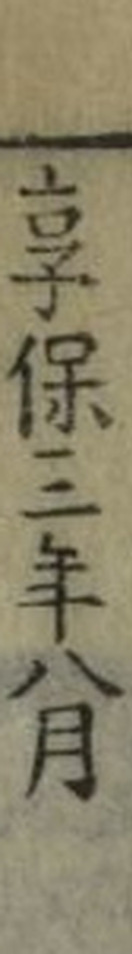享保三年八月同
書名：琉球人行列記
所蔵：University of the Ryukyus Library
